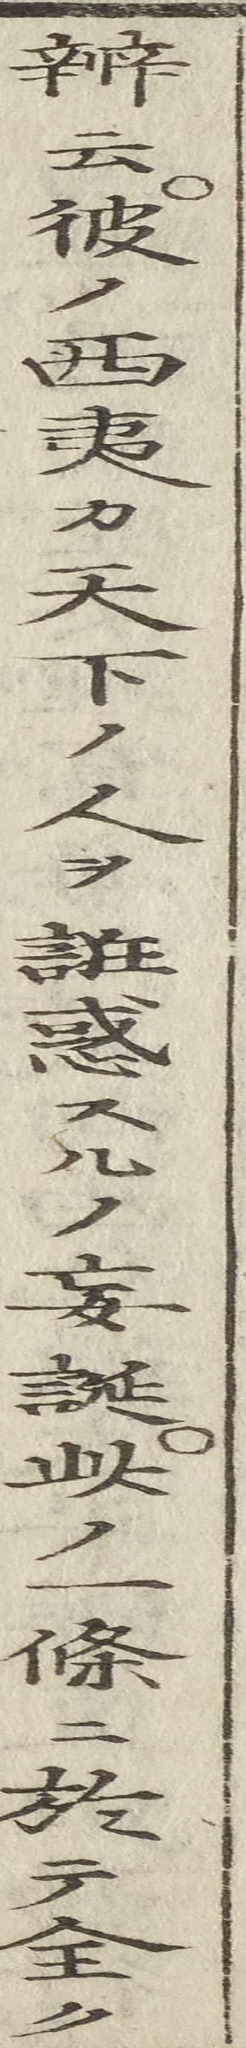弁云。彼ノ西夷カ天下ノ人ヲ誑惑スルノ妄誕。此ノ一条ニ於テ全ク
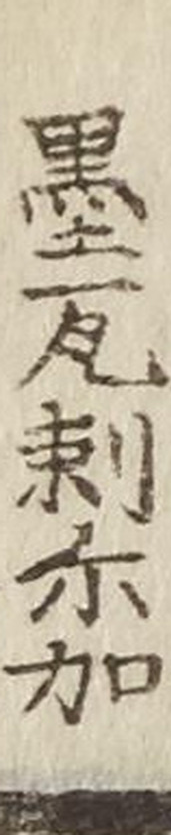墨瓦刺尓加
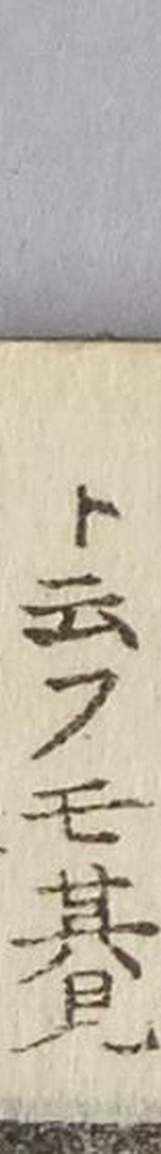ト云フモ其見
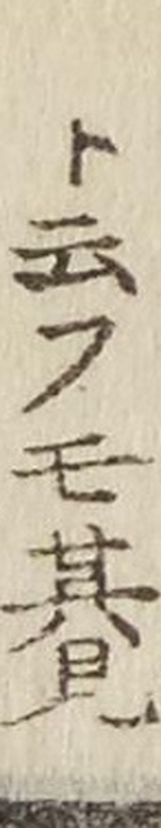ト云フモ其見
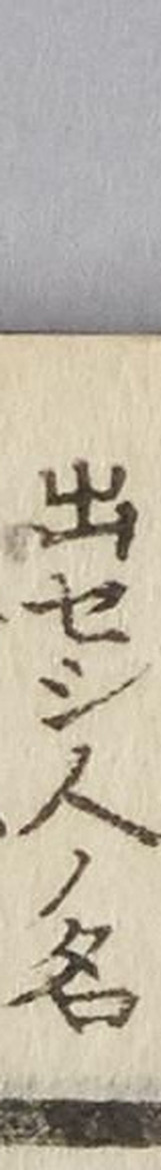出セシ人ノ名
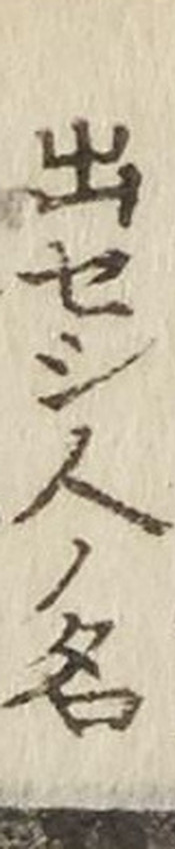出セシ人ノ名
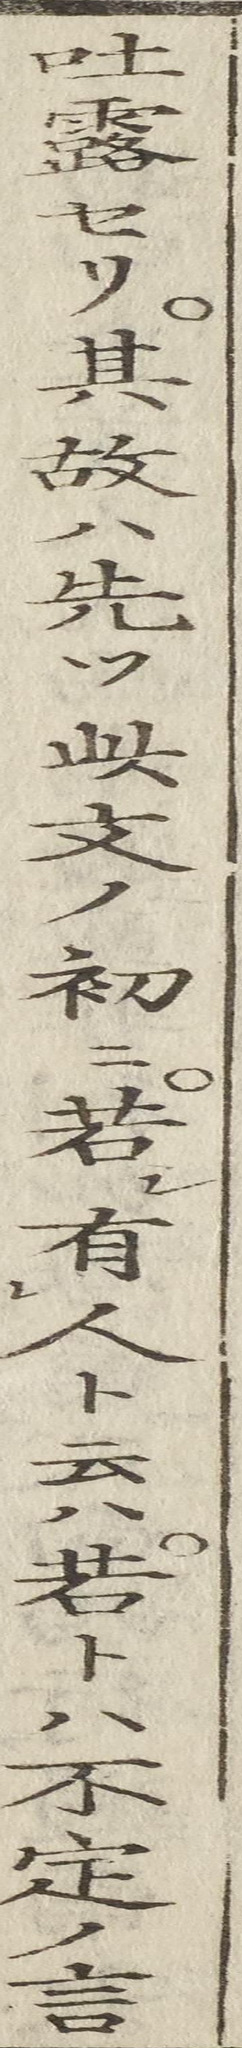吐露セリ。其故ハ先ツ此文ノ初ニ。若有人ト云ハ。若トハ不定ノ言
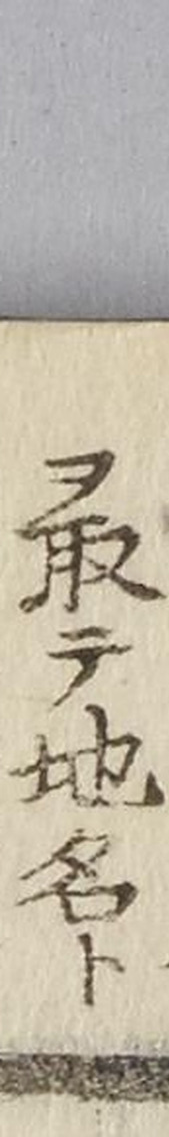ヲ取テ地名ト
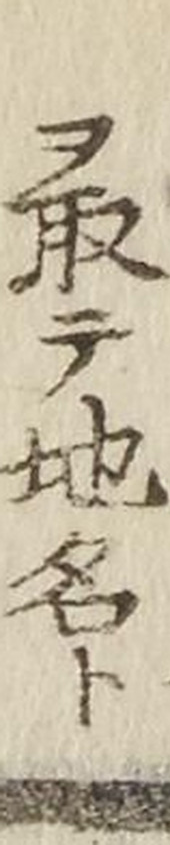ヲ取テ地名ト
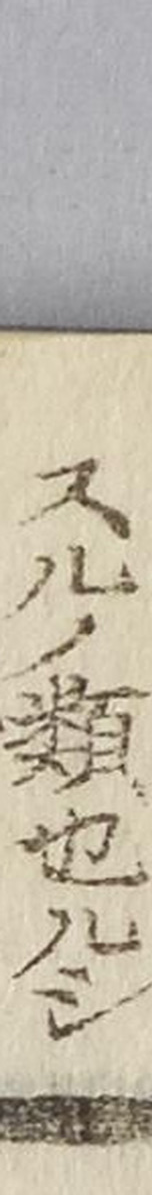スルノ類也ルシ
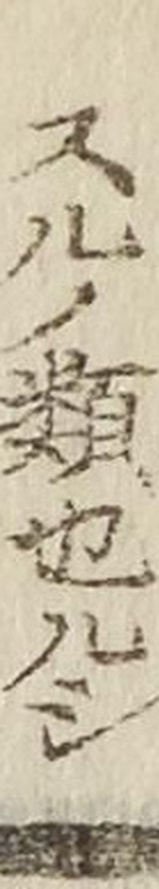スルノ類也ルシ
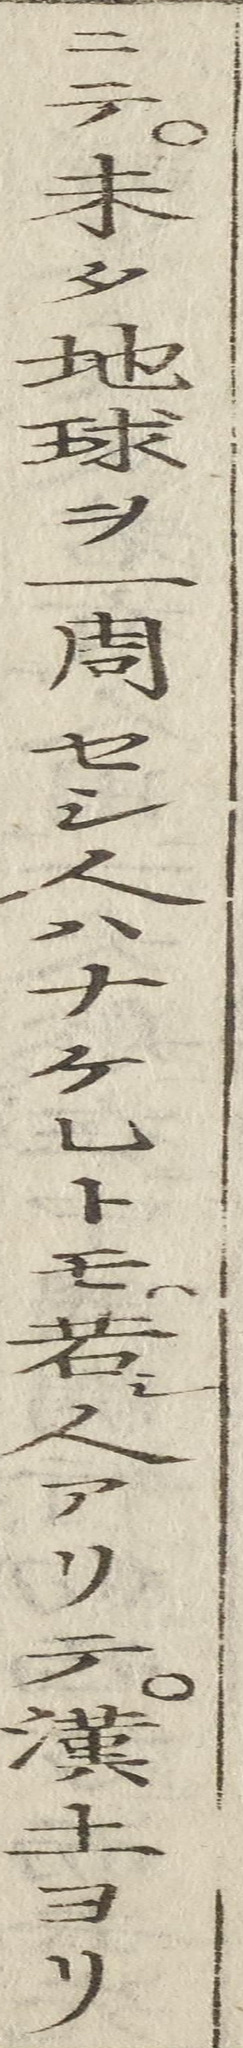ニテ。来タ地球ヲ一周セシ人ハナケレトモ。若人アリテ。漢土ヨリ
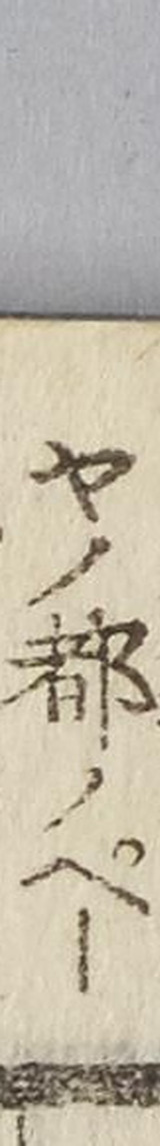ヤノ都ノペー
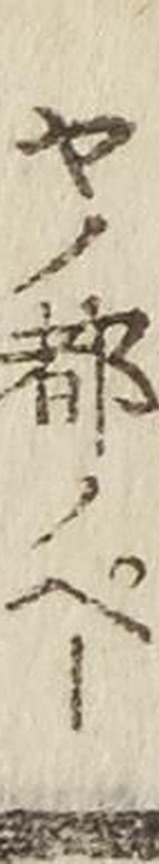ヤノ都ノペー
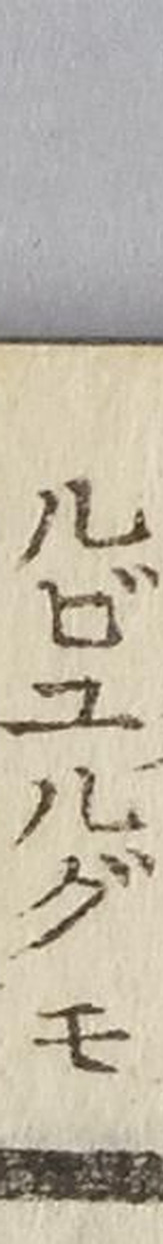ルビユルグモ
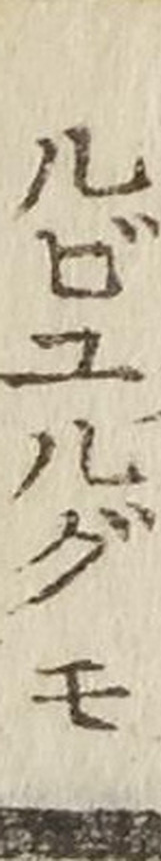ルビユルグモ
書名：護法新論　中
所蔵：東京大学地震研究所図書室 Earthquake Research Institute Library, The University of Tokyo, JAPAN
